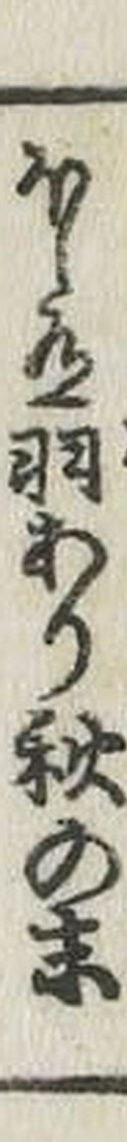ほし有羽あり秋の末
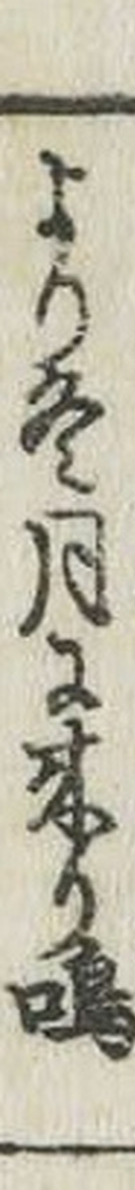より冬月に来り鳴
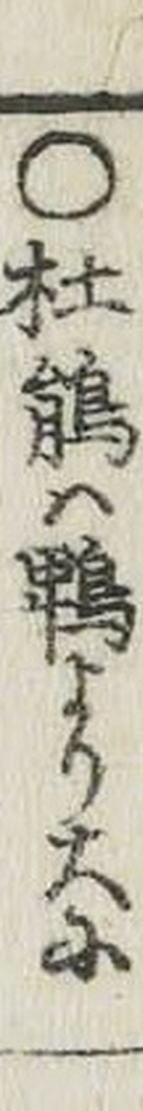○杜鵑は鵯より大に
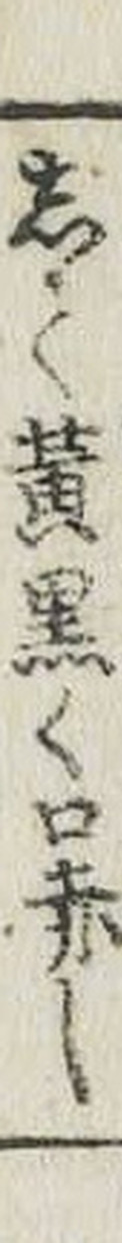して黄黒く口赤し
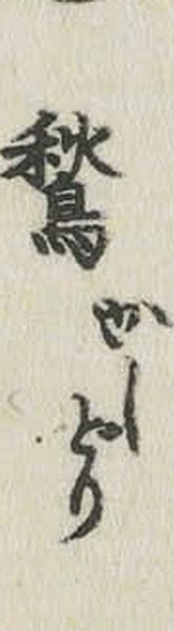鶖かしどり
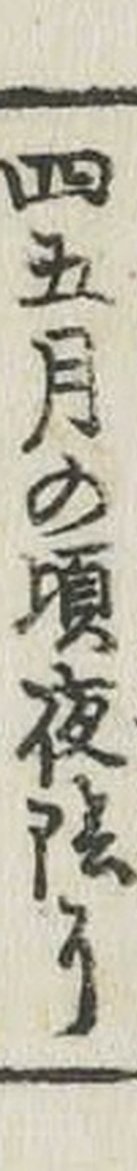四五月の頃夜陰に
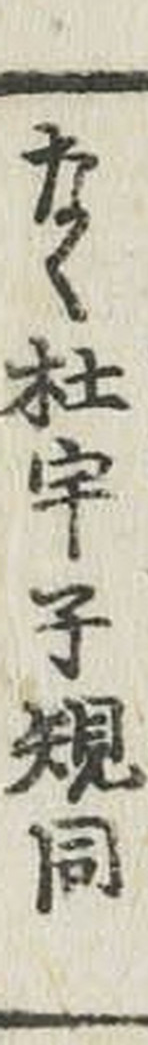なく杜宇子規同
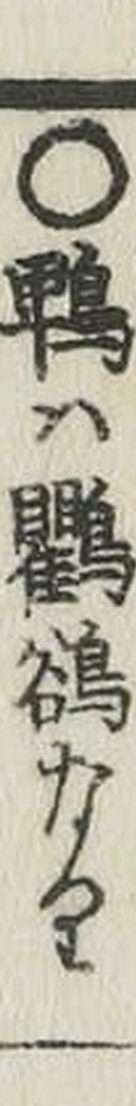○鵯は鸜鵒なり
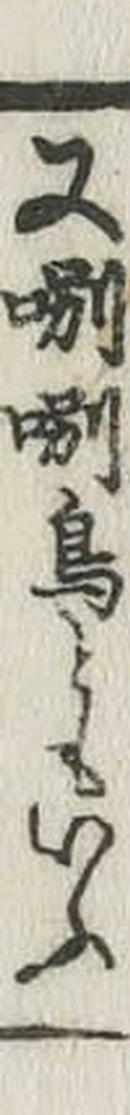又哵哵鳥ともいふ
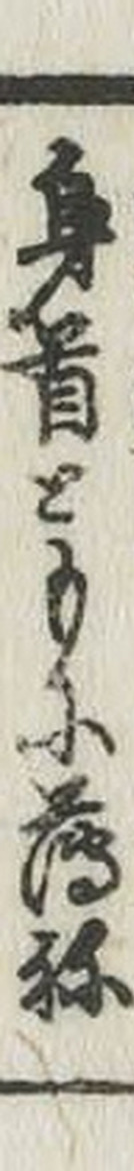身首ともに薄ね
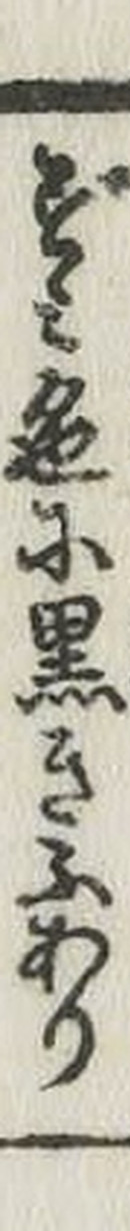ずみ色に黒きふあり
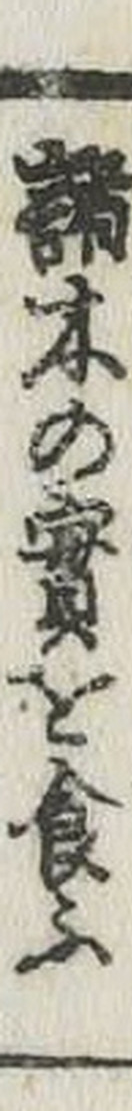諸木の実を食ふ
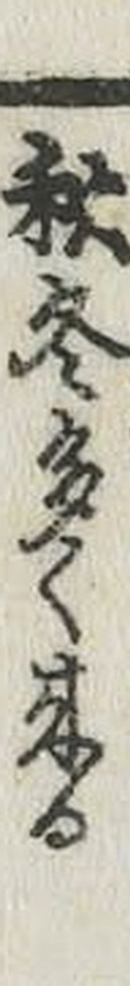秋冬多く来る
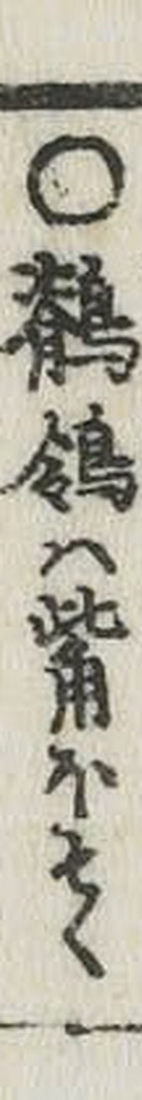○鶺鴒は觜ほそく
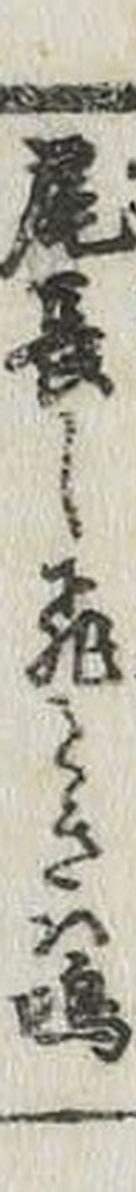尾長し飛ときは鳴
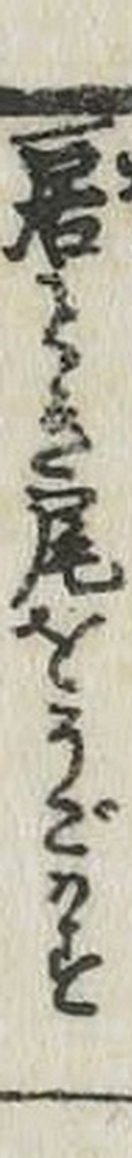居とき尾をうごかす
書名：増補頭書訓蒙図彙大成 10巻 6:巻之12-13
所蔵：東京学芸大学教育コンテンツアーカイブ
